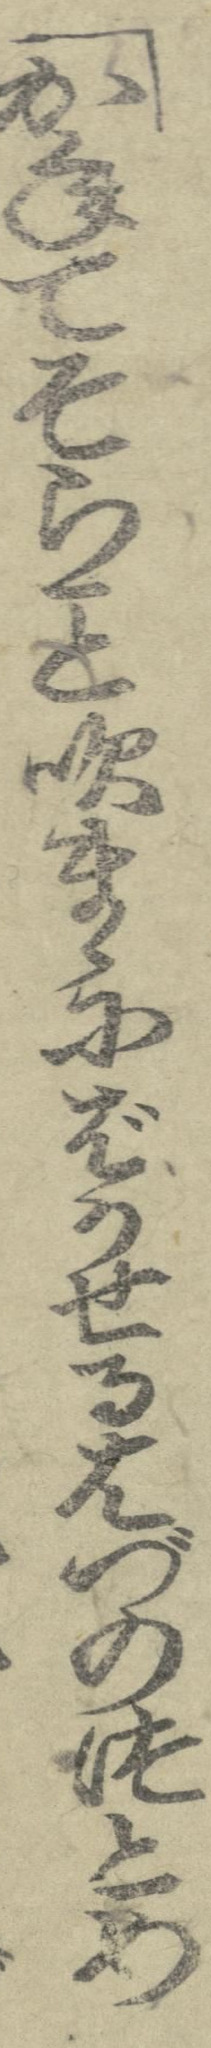かねてそらこと吹まゝにばかせるはづのつとめ
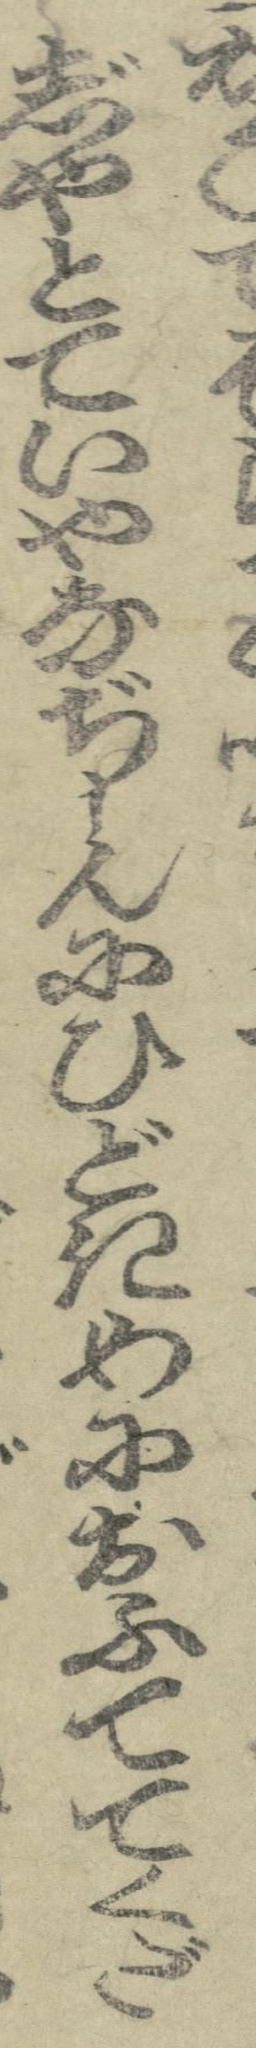じやとていやなぢしんにひどきめにおふててくだ
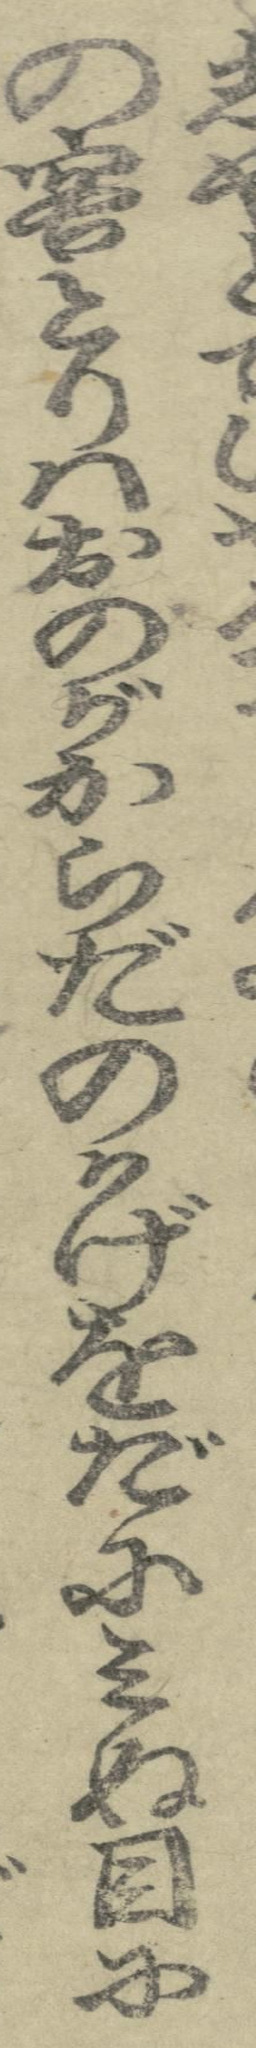の客とりはおのがからだのかげをだにみぬ目に
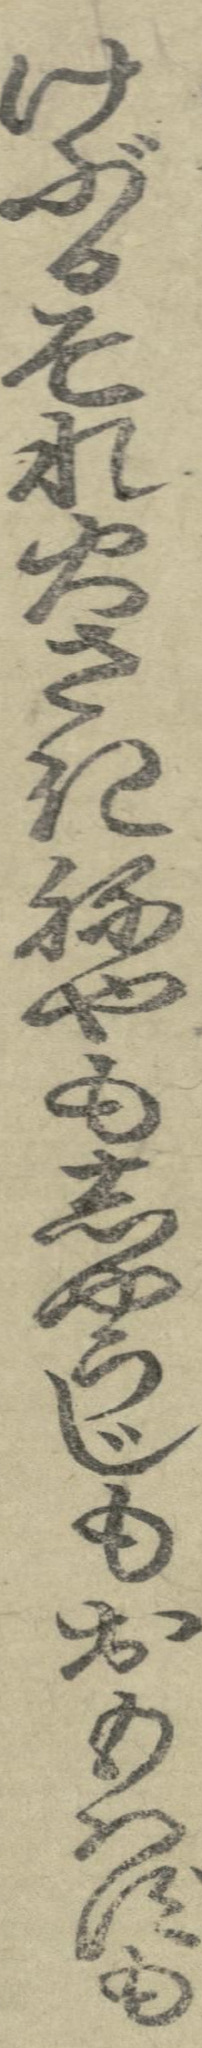けぶるそれ火さきねやもしやうじもおもはずも
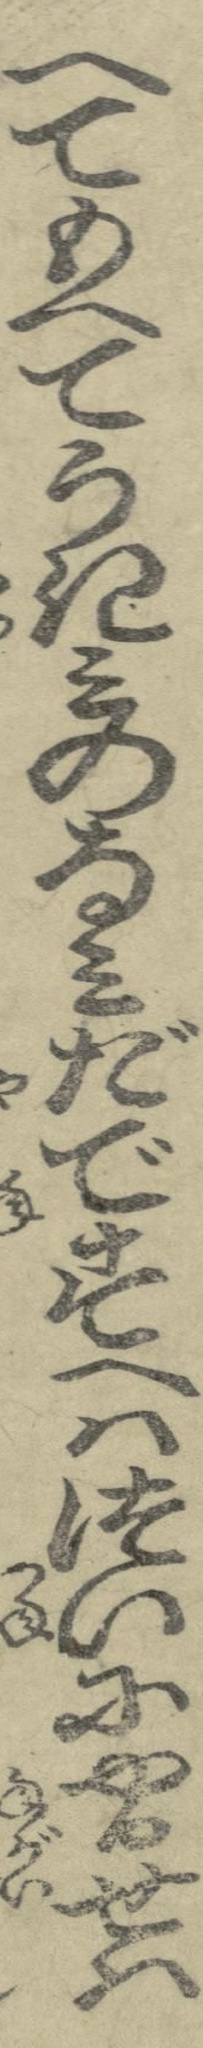へてもへてうきみのなみだですへはついにやるせは
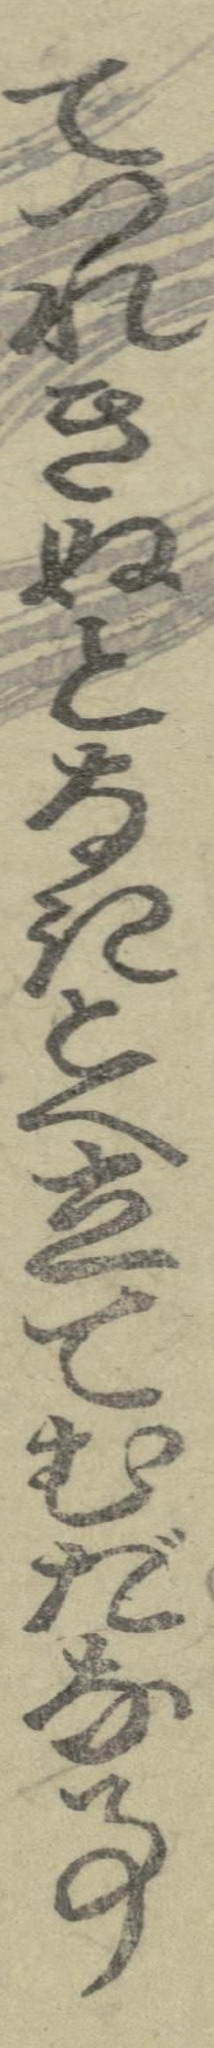てつれきぬとなきこへ立てむだな事
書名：傾城あだなの焚
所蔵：東京大学地震研究所図書室 Earthquake Research Institute Library, The University of Tokyo, JAPAN
